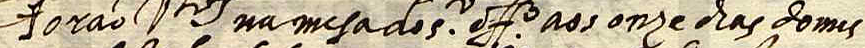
Foraõ Vtos na mesa do s.to offo. aos onze dias do mes
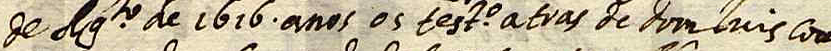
de Ag.to de 1616. anos os test.o atras de dom luis cou
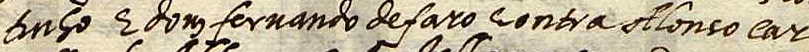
tinho E dom fernando de faro contra Alonso car
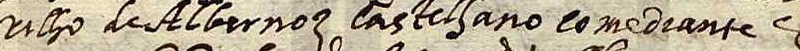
rilho de Albernoz castelhano comediante E
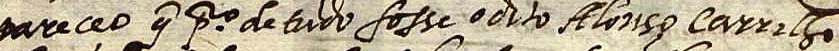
pareceo q̄ p.ro de tudo fosse o dito Alonso Carrilho
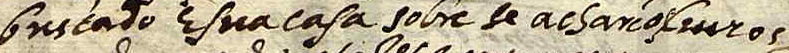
buscado E sua casa sobre se acharē os liuros
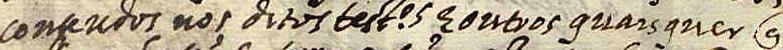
conteudos nos ditos test.os E outros quaisquer q̄
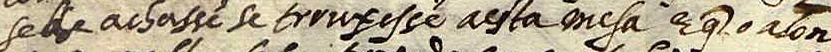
se lhe achassē se trouxessē a esta mesa E q̄ o alon
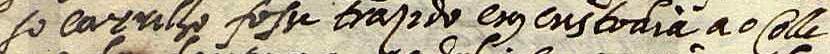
so carrilho fosse trazido em custodia ao Colle
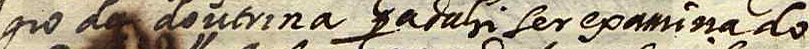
gio da doutrina ꝑa dahi ser examinado
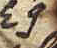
E q̄
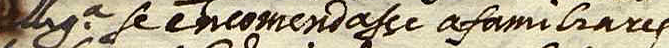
ellig.a se encomendasse a familiares
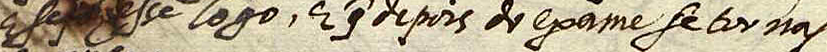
E se fizesse logo, E q̄ depois do exame se tornas
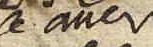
se a uer
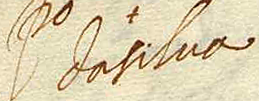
Po da silua
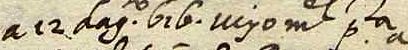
a 12 dag.to 616. ueyo mel p.ra a
